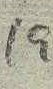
19
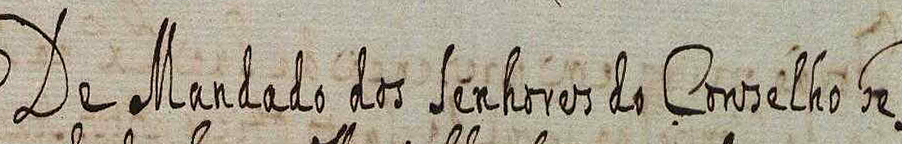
De Mandado dos Senhores do Conselho Ge
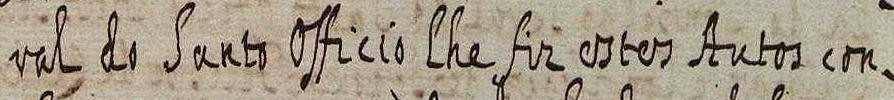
ral do Santo Officio lhe fiz estes Autos con
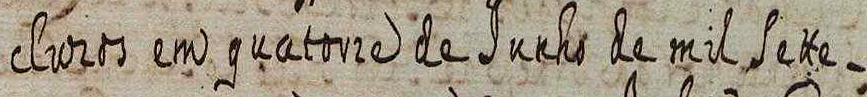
cluzos em quatorze de Iunho de mil Sette
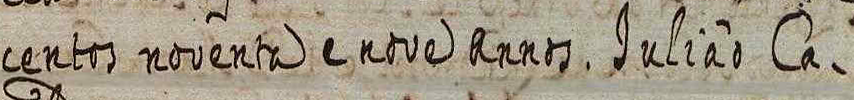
centos noventa e nove annos. Iulião Ca
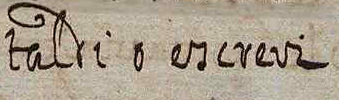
taldi o escrevi
